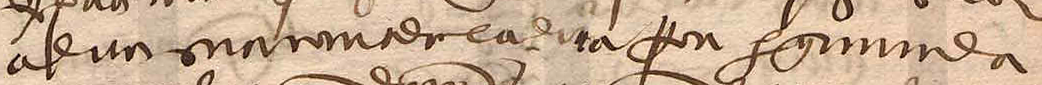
a dita sua comadre e a dita foe ꝑguntada
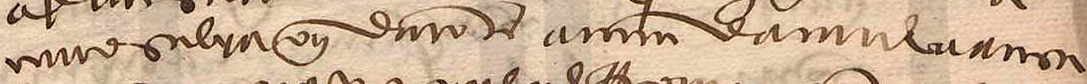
como sabya o q̄ dito tē acerca da candea acesa
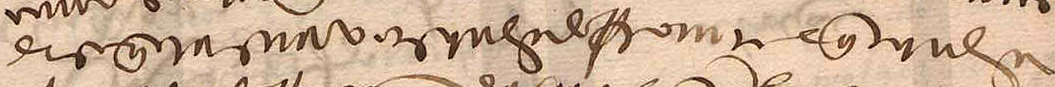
dise q̄ era sua visynha defromte e q̄ tynha
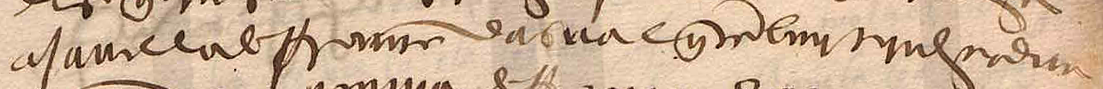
a Janella defromte da sua e q̄ tābem tynha a dita
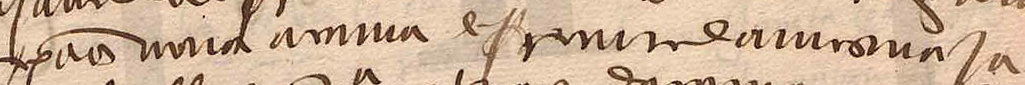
xpāa noua a cama defromte da mesma Ja
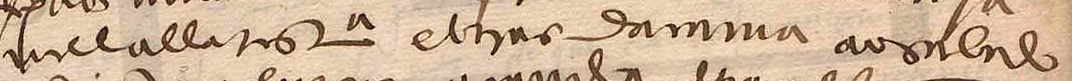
nella dela testa e detras da cama ao sabado
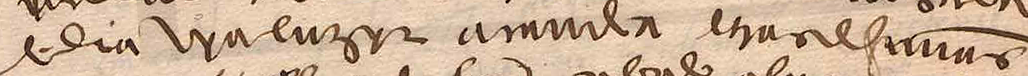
de dia vya luzyr a candea detras de huūas
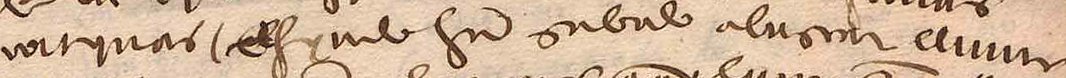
cortynas / E hyndo hū sabado a buscar llume
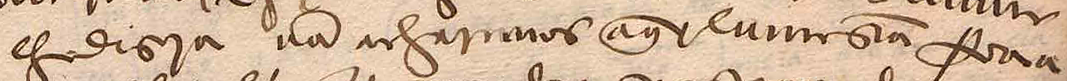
lhe disera nā acharemos aq̄y lume s̄ra foaa
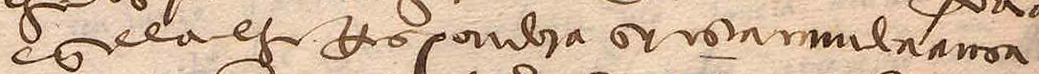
e q̄ ella lhe Respondera sy esta camdea acesa
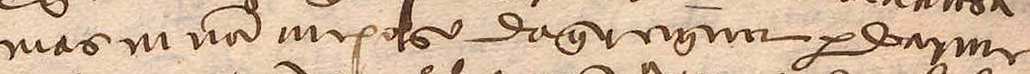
mas eu nā me poso daq̄y erguer ꝑdoayme
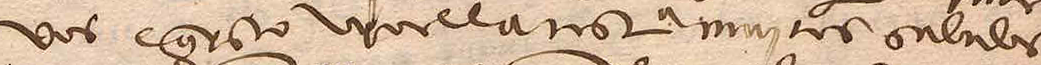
vos e q̄ ysto vyo ella testa mujtos sabados
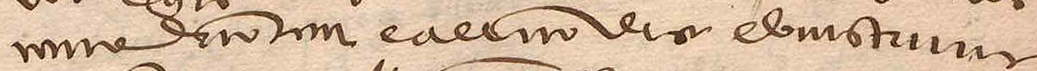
como dito tem e all nō dise e do custume
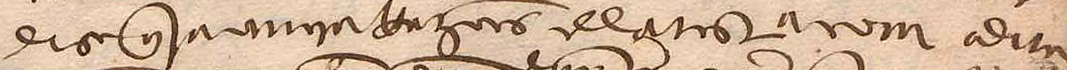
dise q̄ Ja ouuera Razões ella testa com a dita
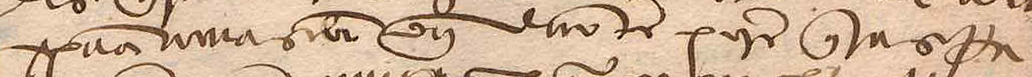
xpaā noua sōbr o q̄ dito tē porē q̄ Ja se fa
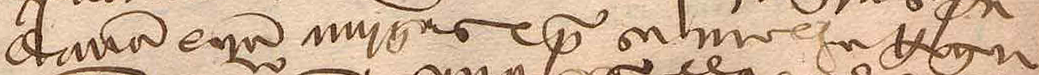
llauā e erā amjgas e p̄o ser molher Rogou
